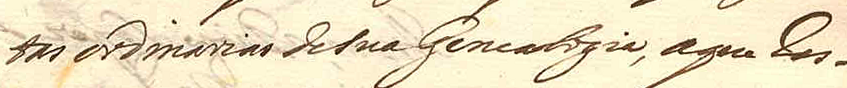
tas ordinarias de sua Genealogia, a que Res
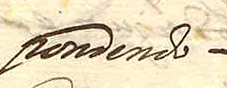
pondendo
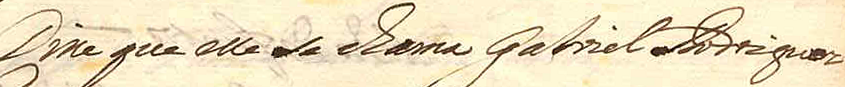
Disse que elle se chama Gabriel Rodriguez
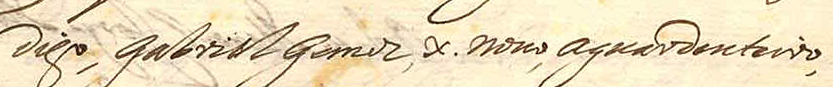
digo, gabriel gomez, x. nouo, aguardenteiro,
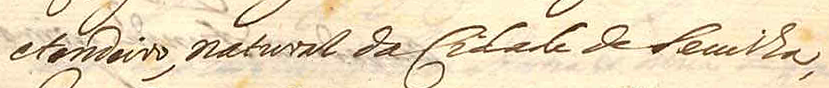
e tendeiro, natural da Cidade de seuilha,
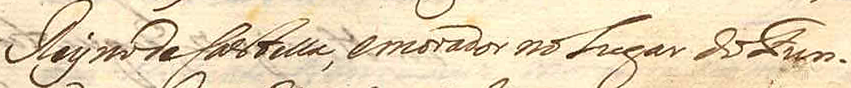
Reyno de Castella, e morador no lugar do Fun
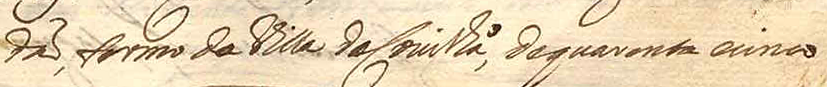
daõ, termo da Villa de Couilhã, de quarenta e cinco
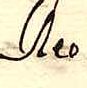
Reo
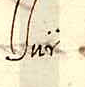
Iur
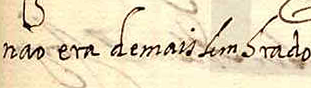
não era demais lembrado
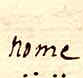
nome
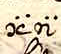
x̄ n̄
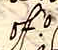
off.o
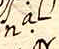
n.al
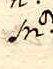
m.or
